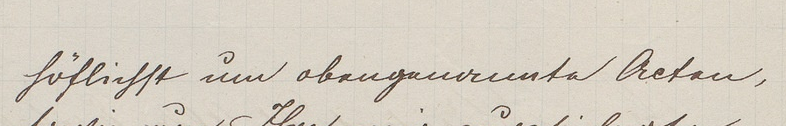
höflichst um obengenannte Acten,
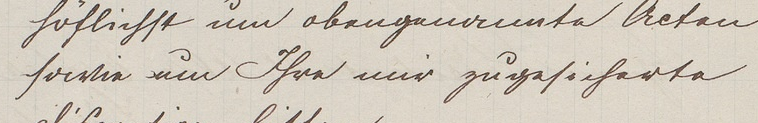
sowie um Ihre mir zugesicherte
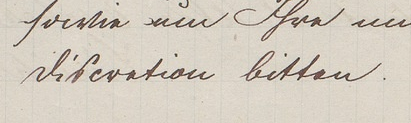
Discretion bitten.
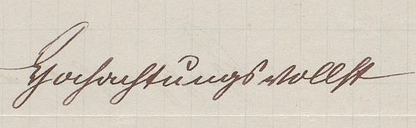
Hochachtungsvollst
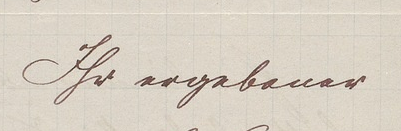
Ihr ergebener
